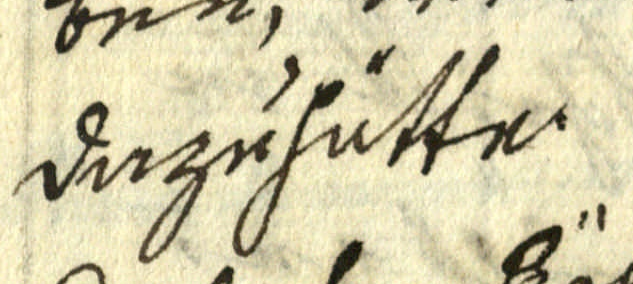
dazu hätte.
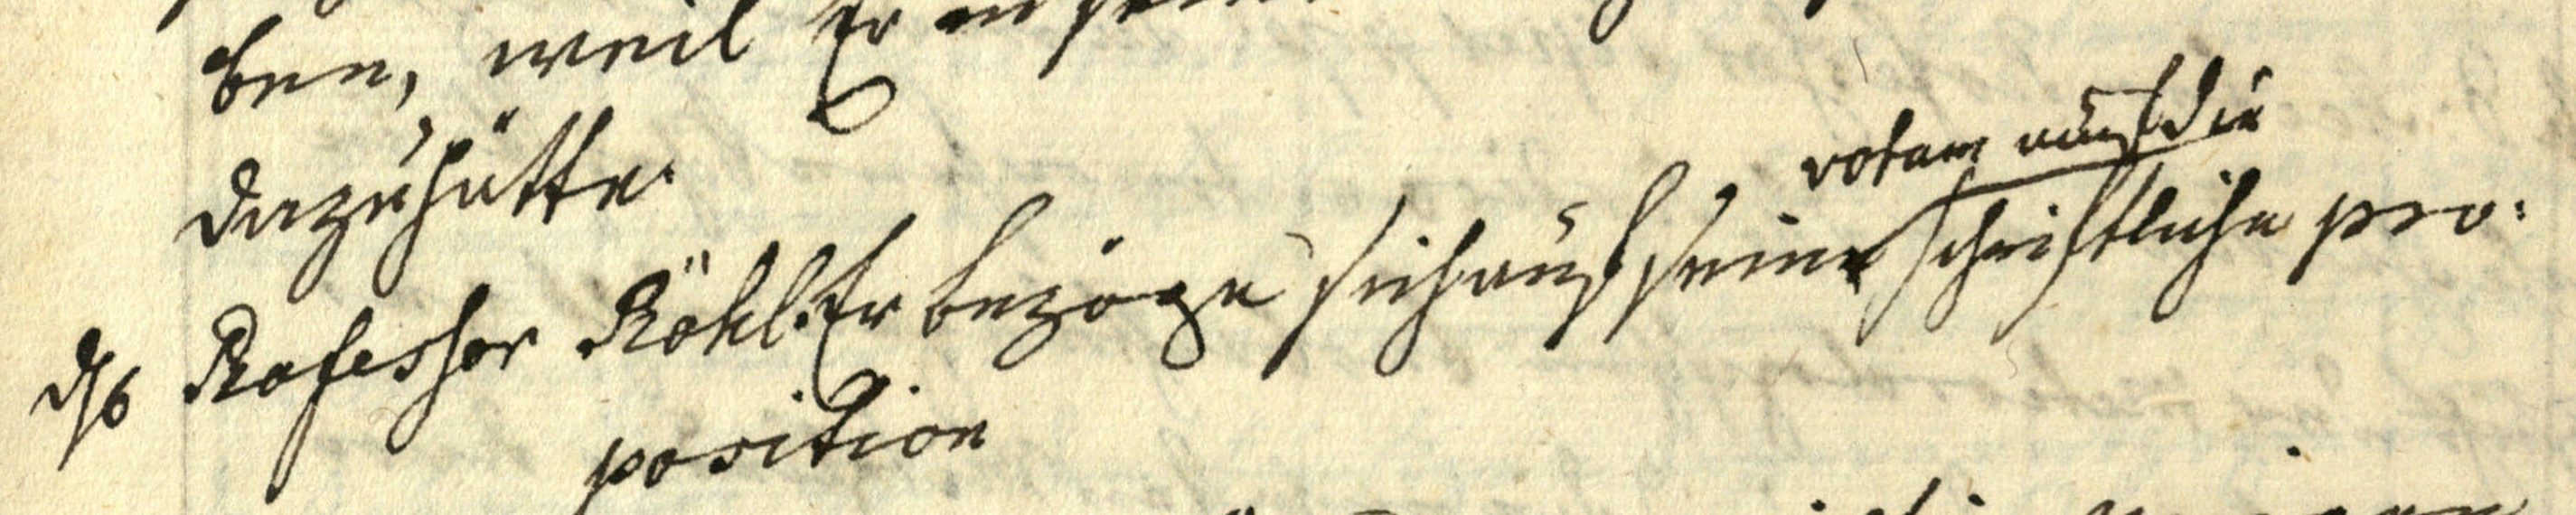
dh. Professor Röhl. Er bezöge sich aus sein votum auf die schriftliche pro¬
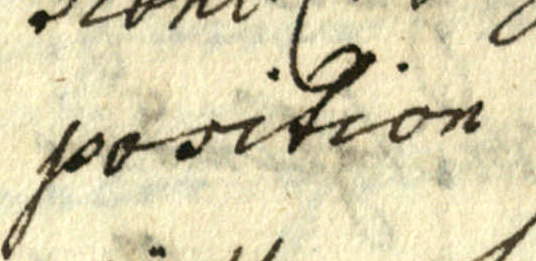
position
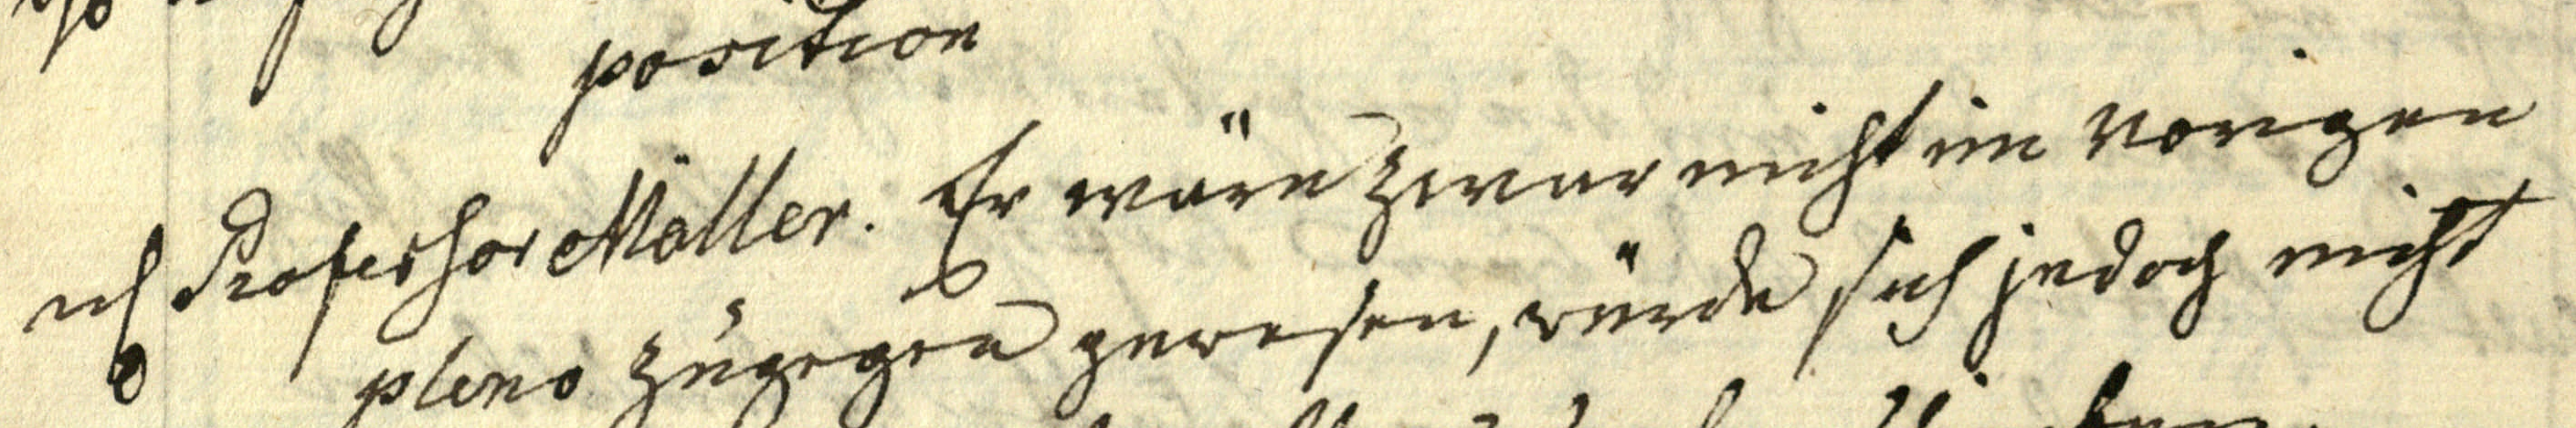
dh Professor Möller. Er wäre zwar nicht im vorigen
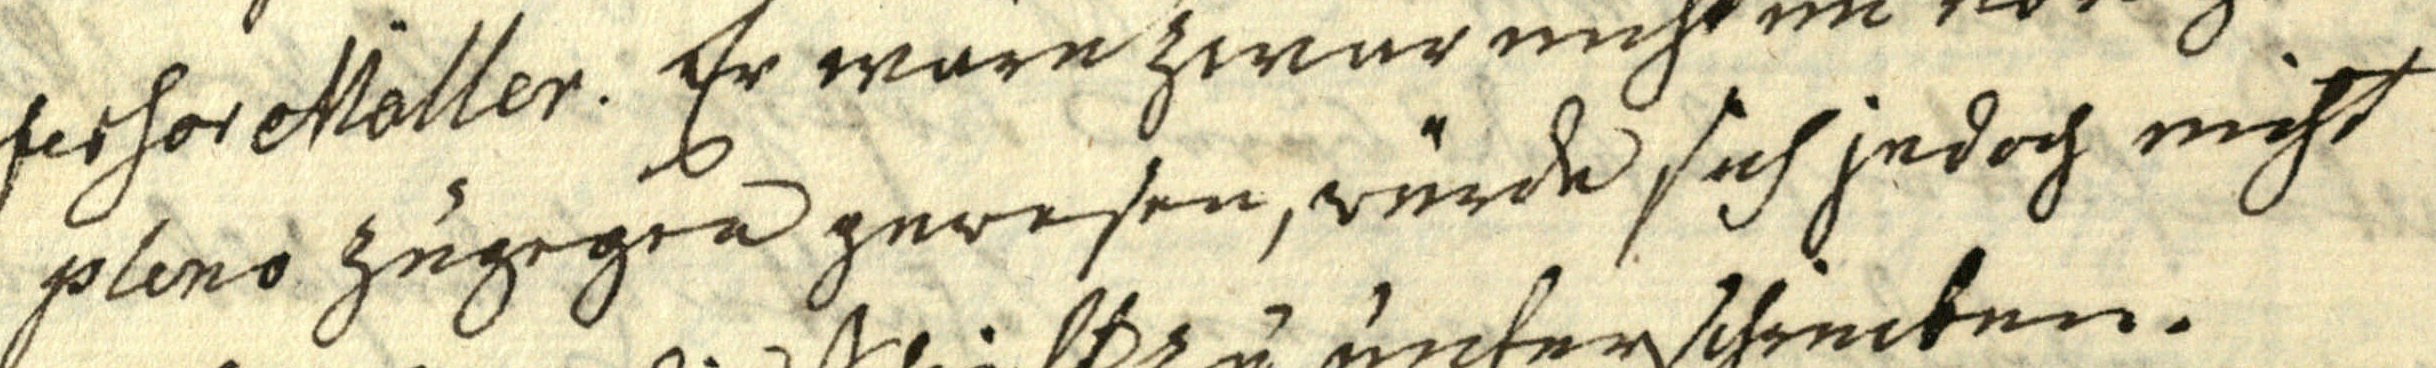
pleno zugegen gewesen, würde sich jedoch nicht
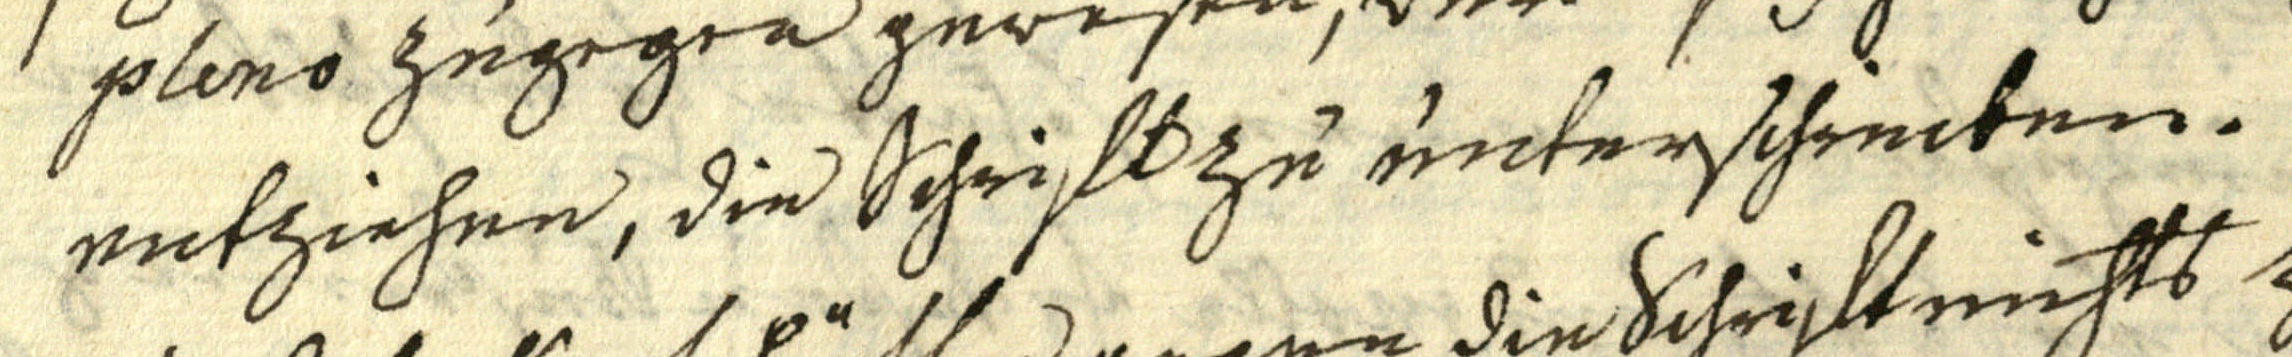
entziehen, die Schrift zu unterschreiben.
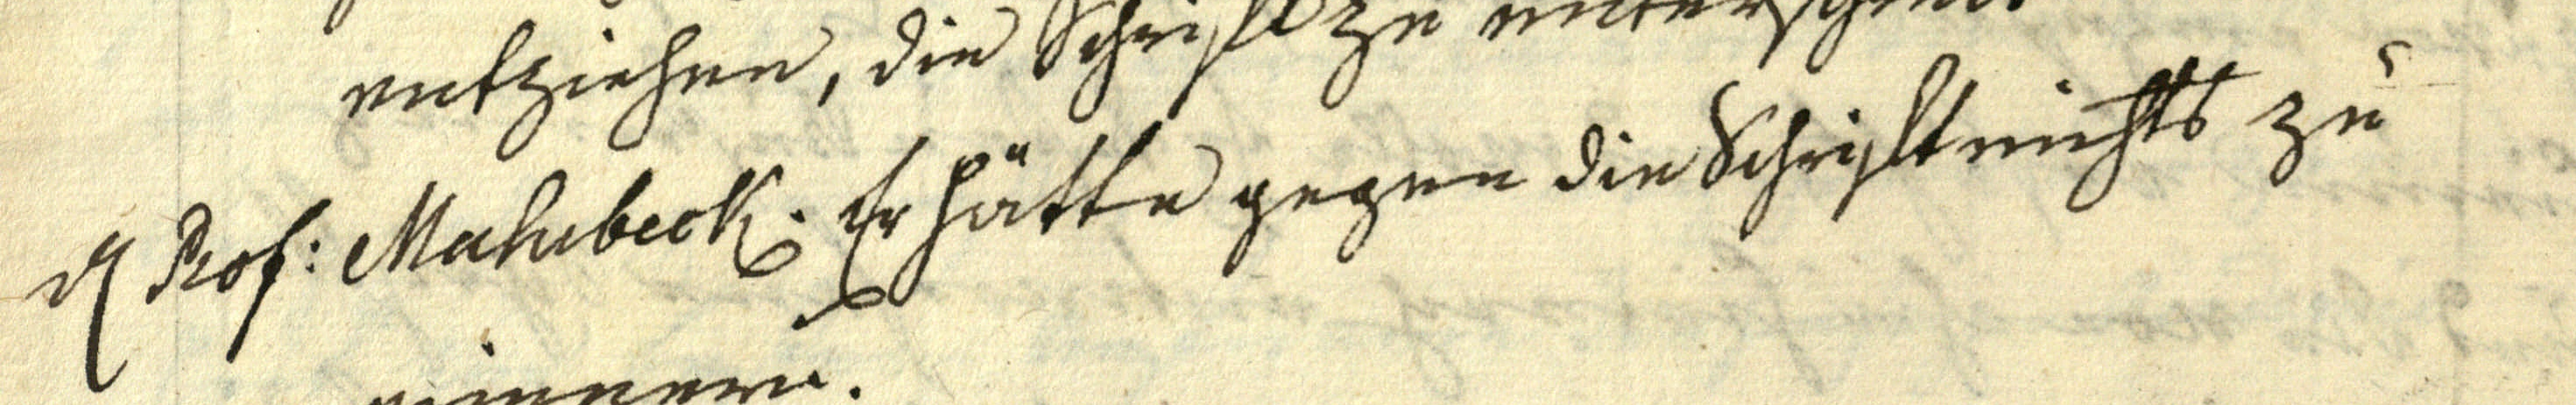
dh Prof. Muhrbeck. Er hätte gegen dieSchrift nichts zu
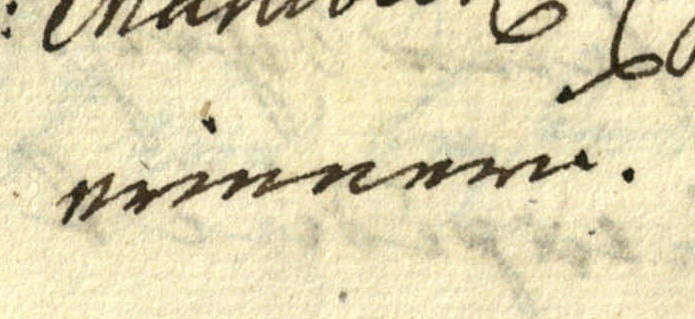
erinnern.
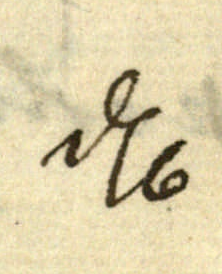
dh
